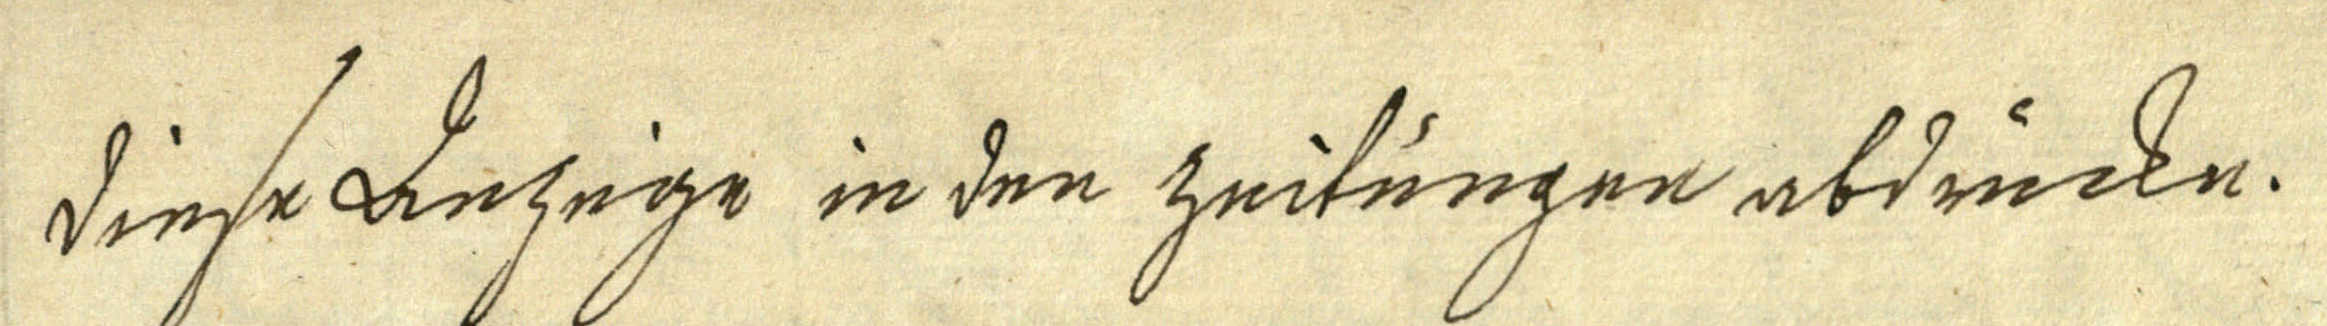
diese Anzeige in den Zeitungen abdrucke.
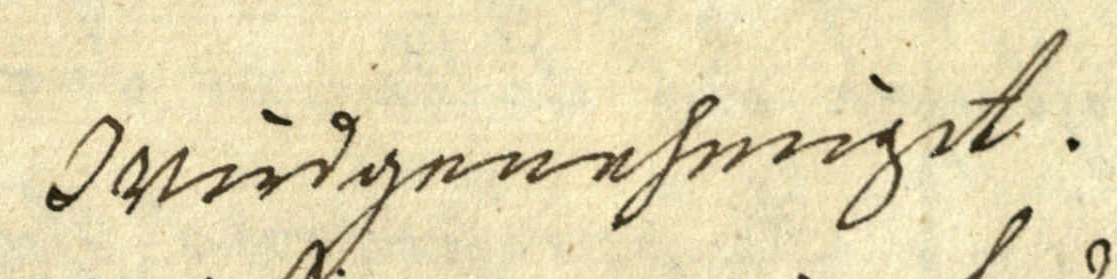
Wird genehmiget.
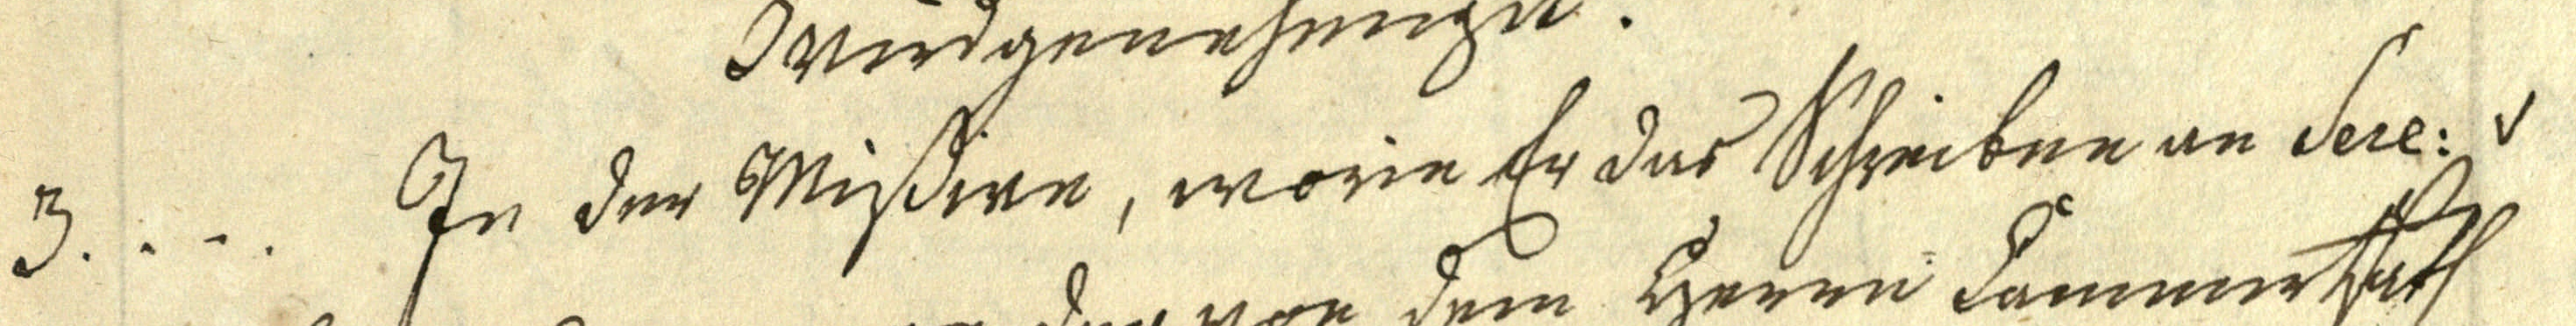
3. In der Mißive, worin Er das Schreiben an Sere¬
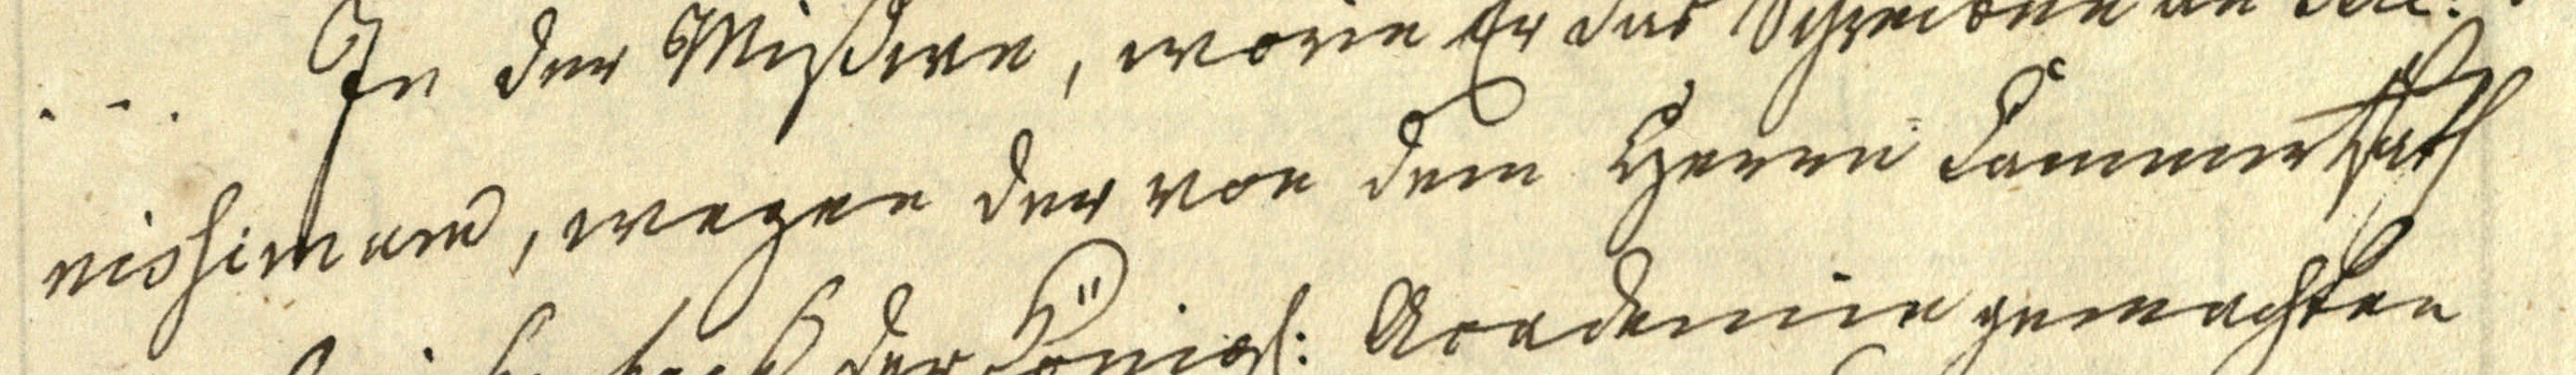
nissimum, wegen der von den Herrn CammerRath
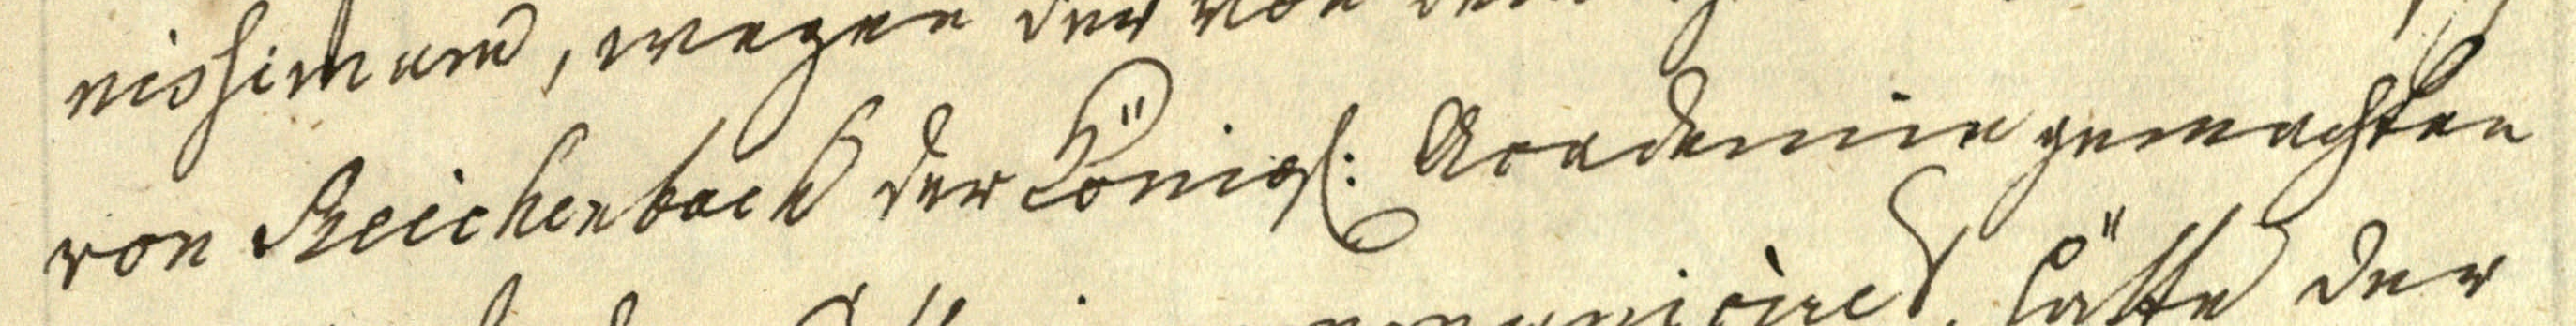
von Reichenbach der Königl. Academie gemachten
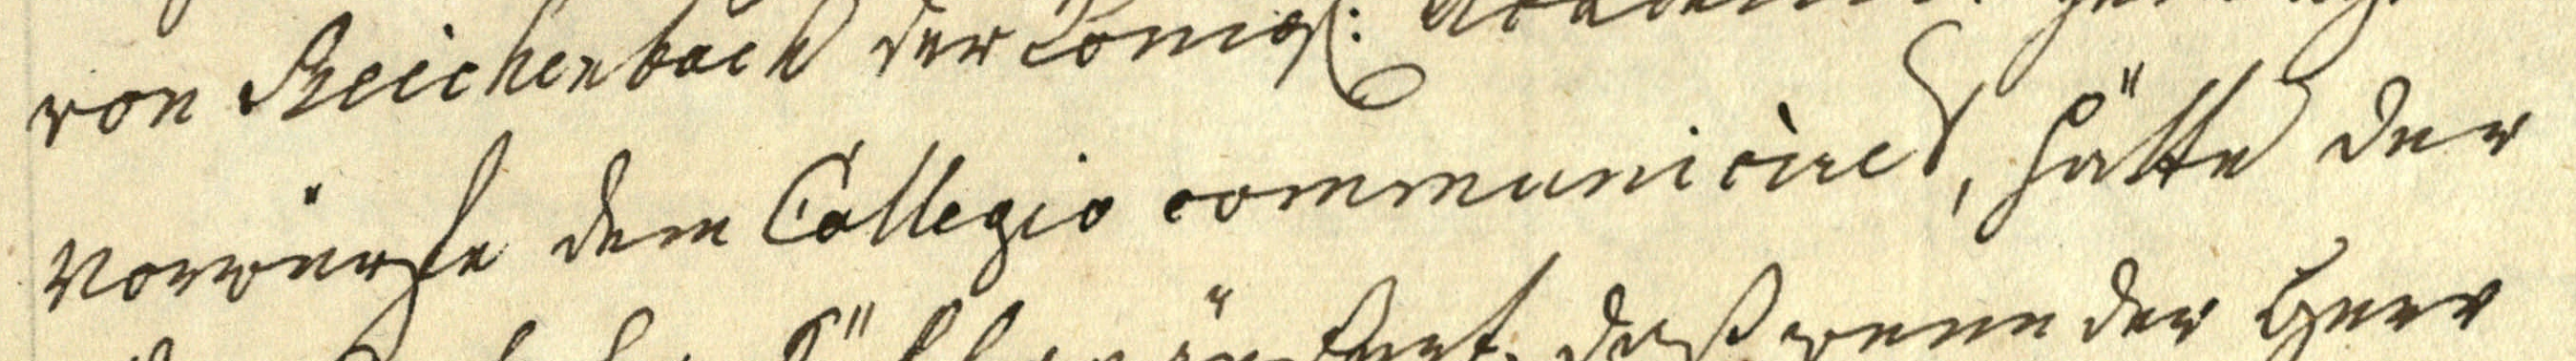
Vorwürfe dem Collegio communiciret, hätte der
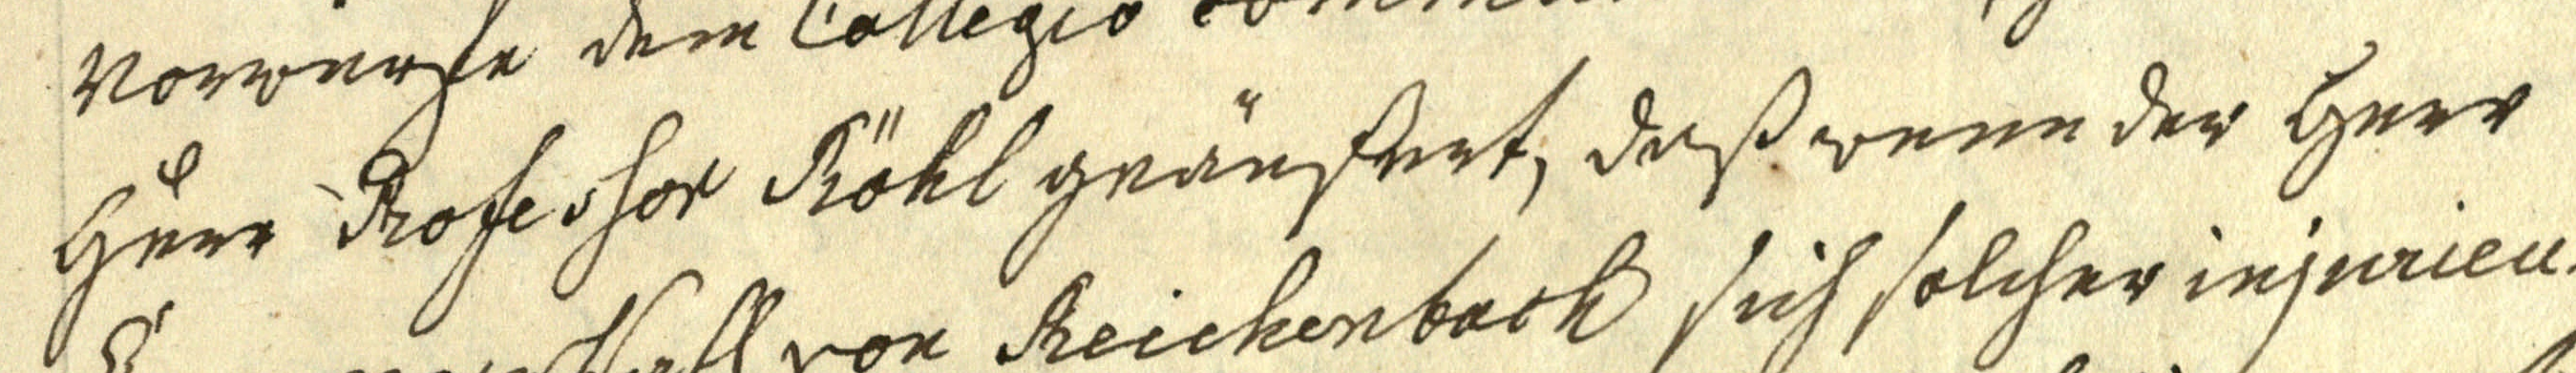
Herr Professor Röhl geäußert, daß wenn der Herr
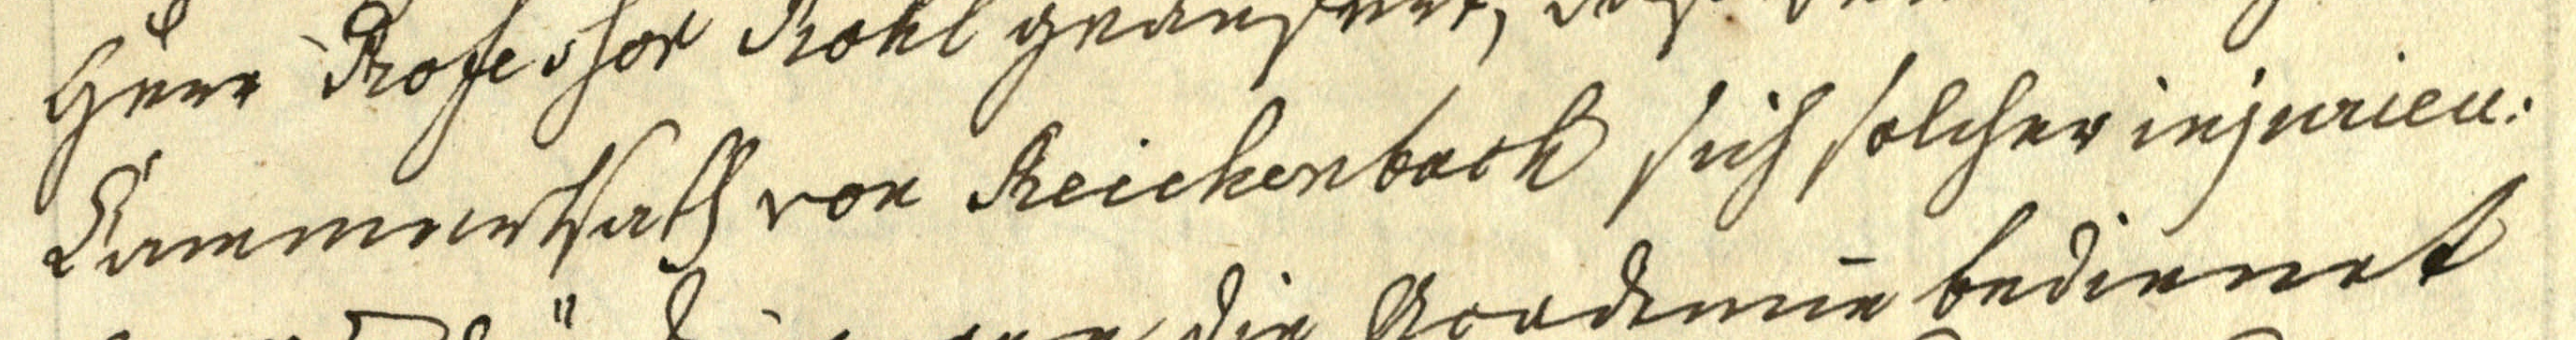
CammerRath von Reichenbach sich solcher injurien¬
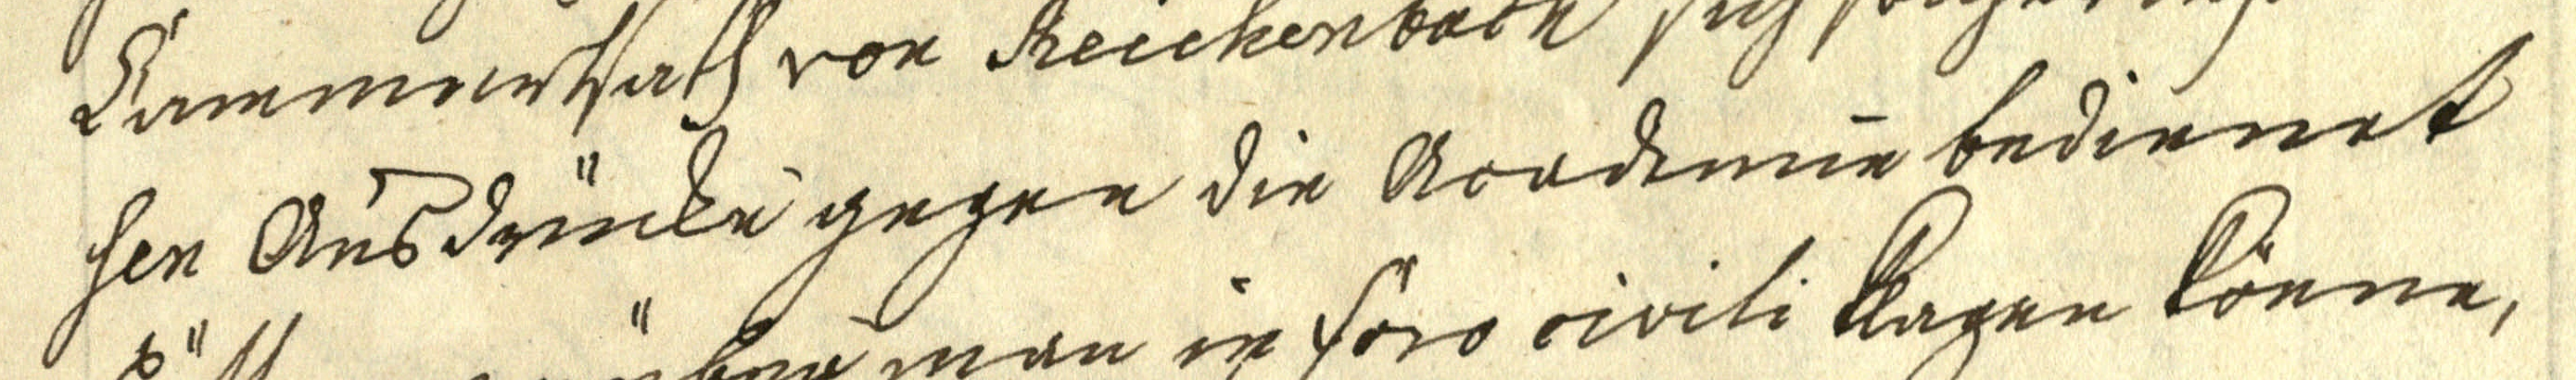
sen Ausdrücke gegen die Academie bedienet
